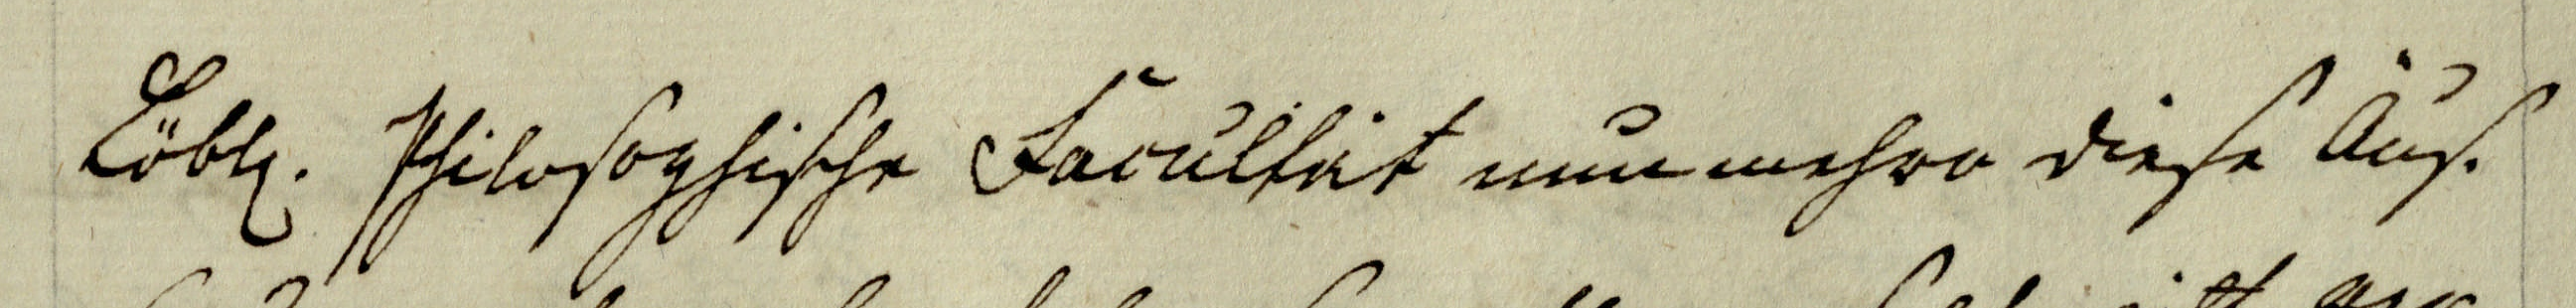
Löbl. Philosophische Facultät nunmehro diese Äus¬
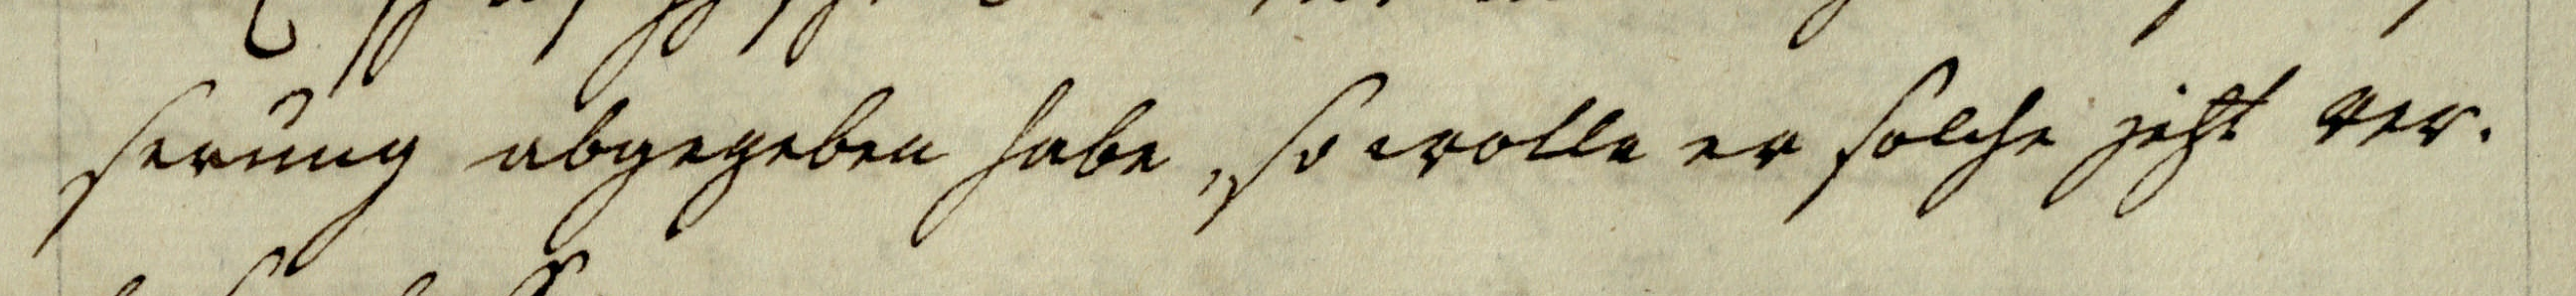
serung abgegeben habe, so wolle er solche jetzt ver¬
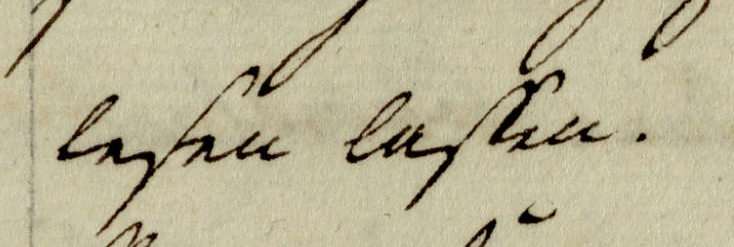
lesen lassen.
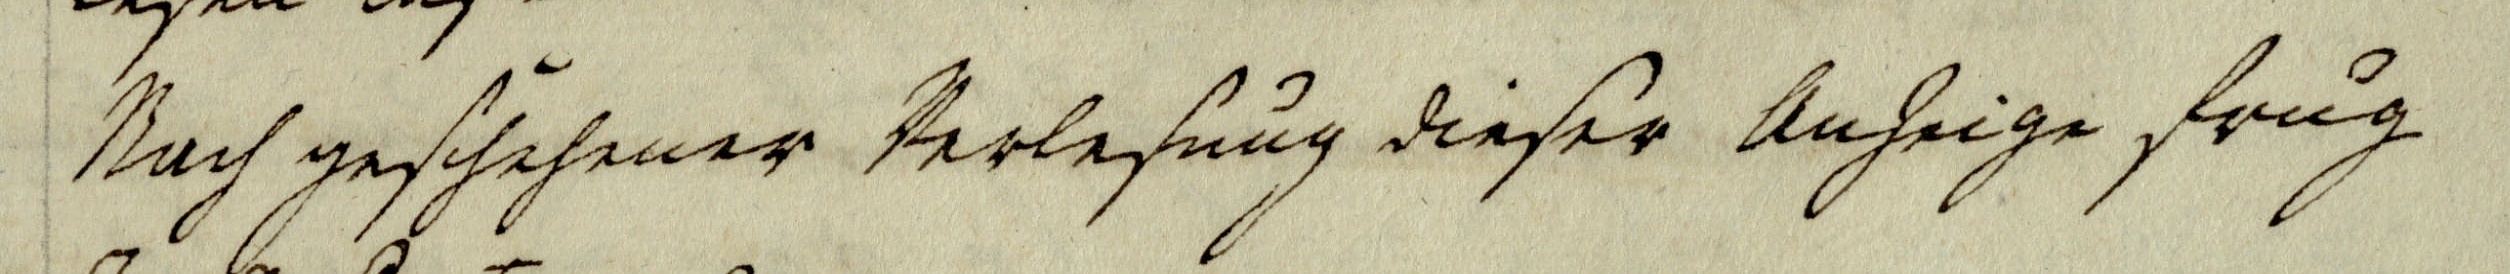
Nach geschehener Verlesung dieser Anzeige frug
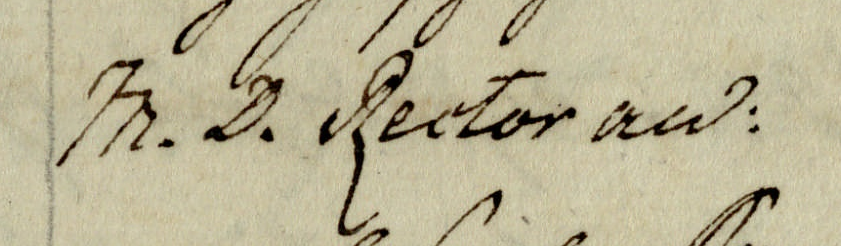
M. D. Rector an:
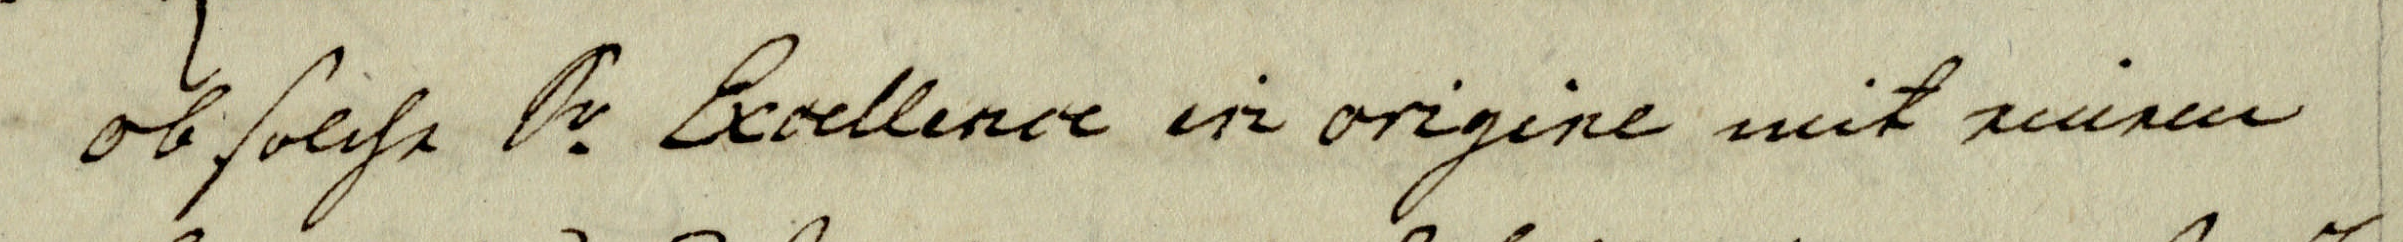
ob solche Sr Excellence in origine mit einem
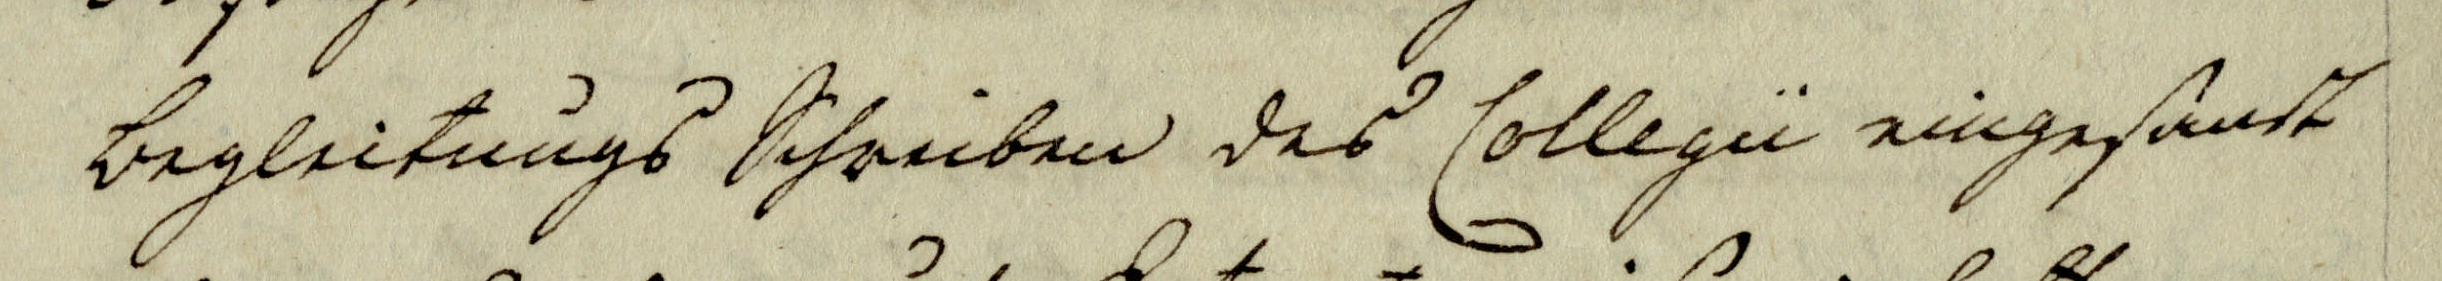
Begleitungs Schreiben des Collegii eingesandt
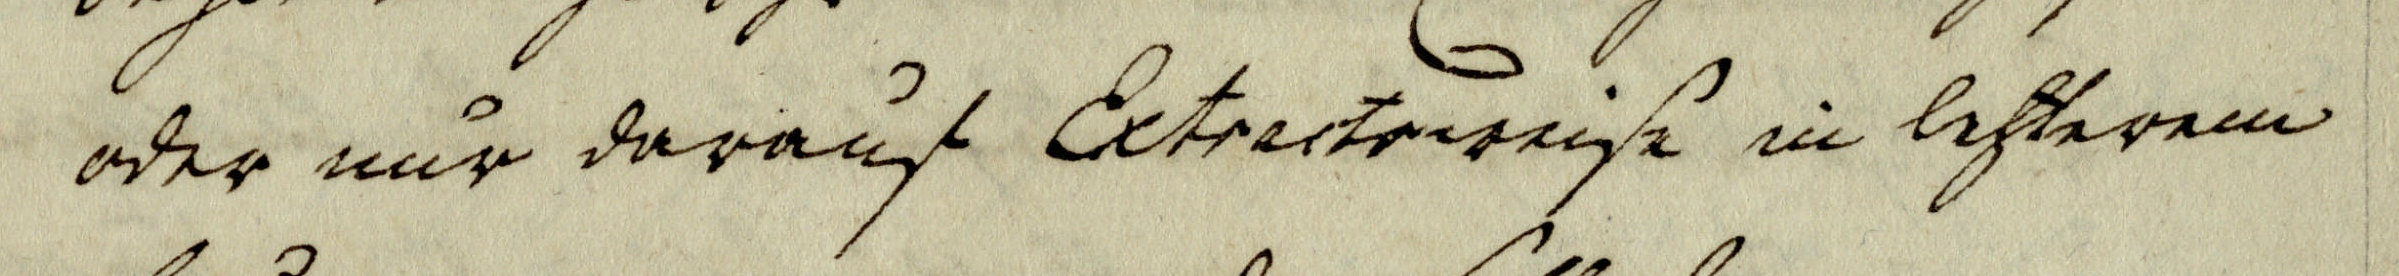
oder nur darauf Exetractsweise in letzterem
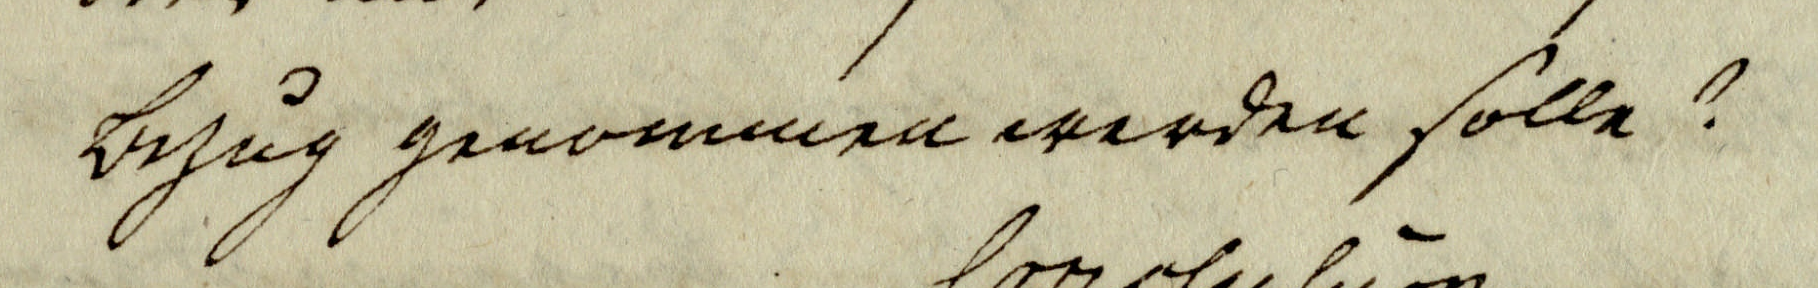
Bezug genommen werden solle?
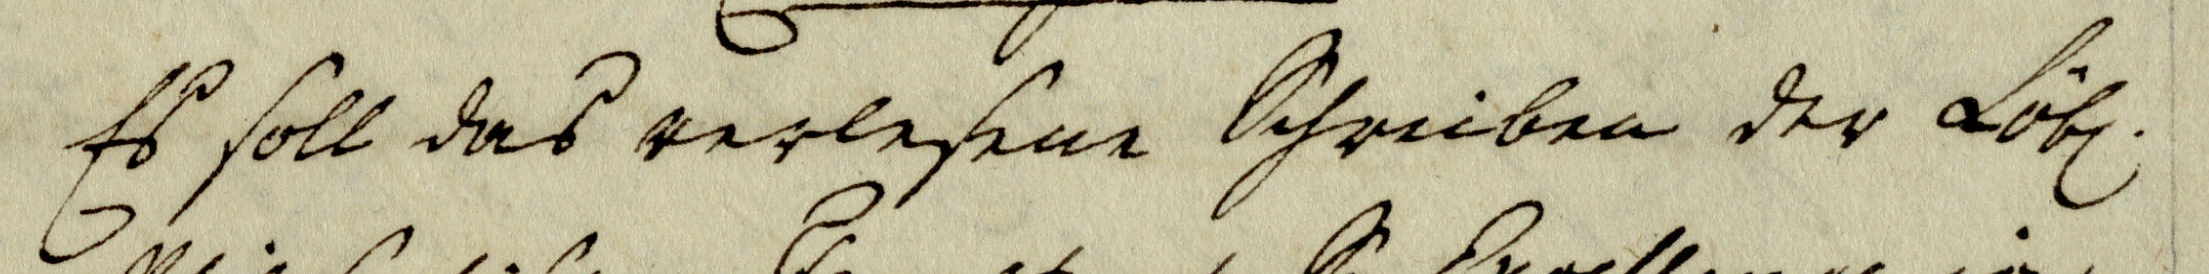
Es soll das verlesene Schreiben der Löbl.
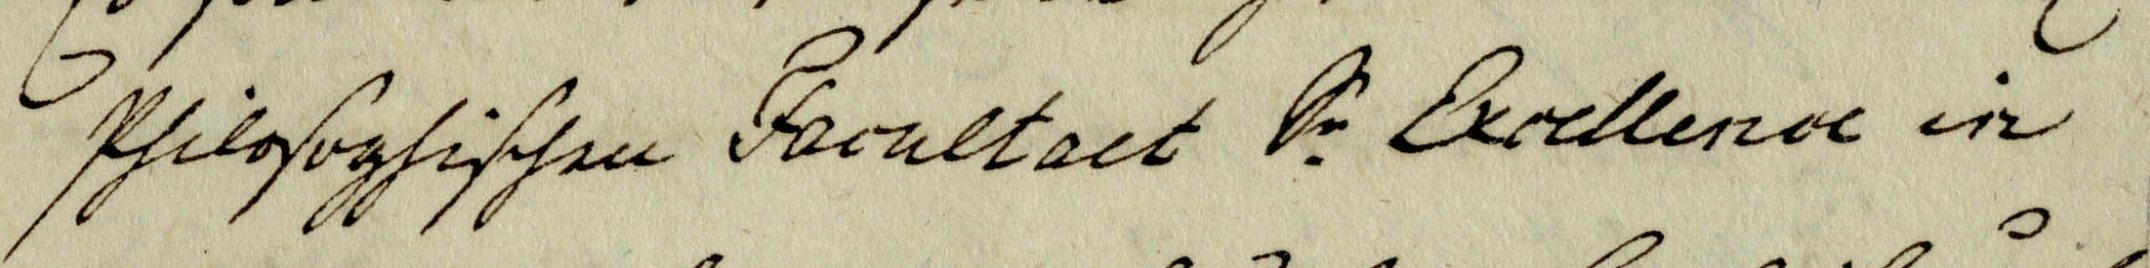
Philosophischen Facultaet Sr Excellence in
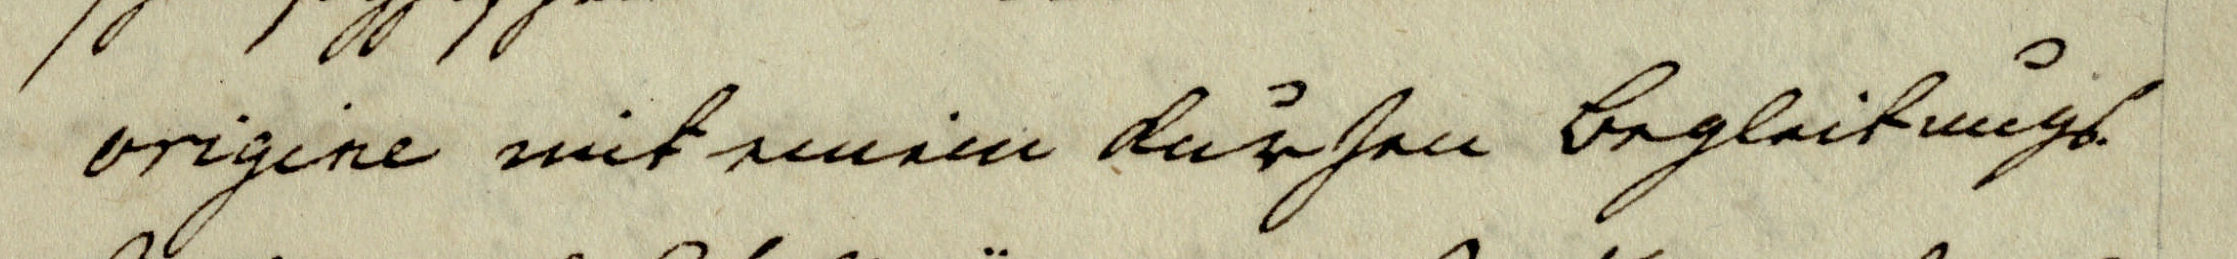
origine mit einem kurzen Begleitungs¬
